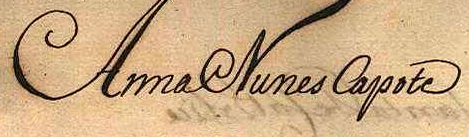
Anna Nunes Capote
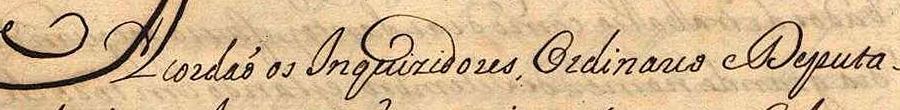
Acordaõ os Inquizidores, Ordinario e Deputa
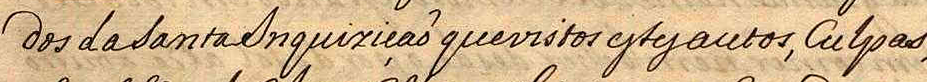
dos da Santa Inquizição que vistos estes autos, Culpas,
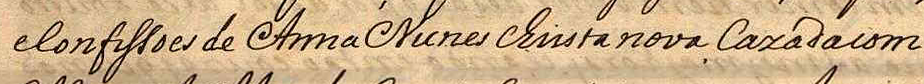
e Confissoes de Anna Nunes christa nova Cazada com
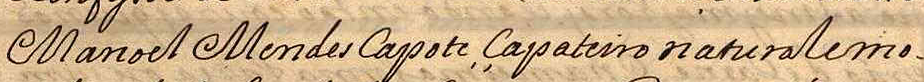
Manoel Mendes Capote, Çapateiro natural e mo
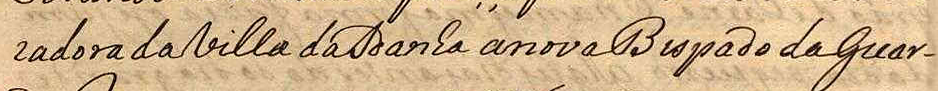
radora da Villa da Ianha a nova Bispado da Guar
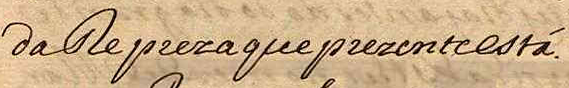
da Re preza que prezente está.
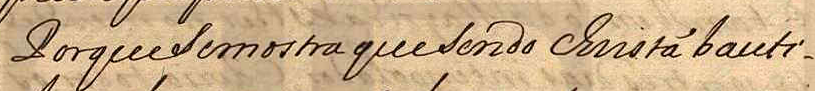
Porque se mostra que sendo christã bauti
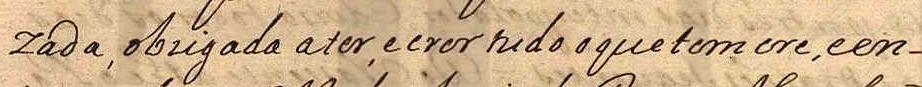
zada, obrigada a ter, e crer tudo o que tem, cre, e en
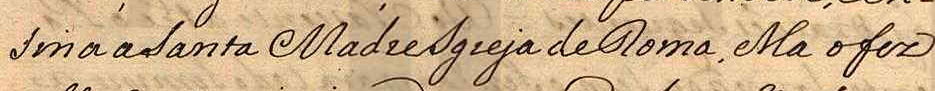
sina a Santa Madre Igreja de Roma ella o fez
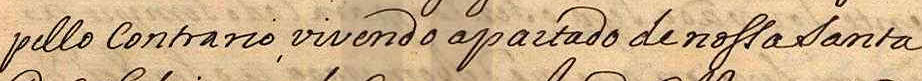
pello contrario vivendo apartado de nossa Santa
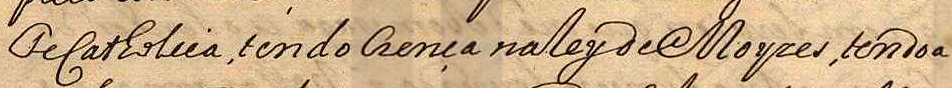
Fe Catholica, tendo Crença na ley de Moyzes, tendo a
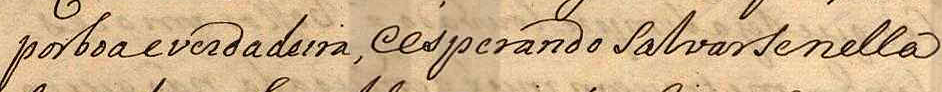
por boa e verdadeira, e esperando salvarse nella
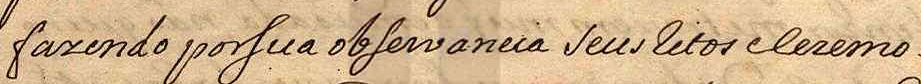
fazendo por sua observancia seus Ritos e ceremo
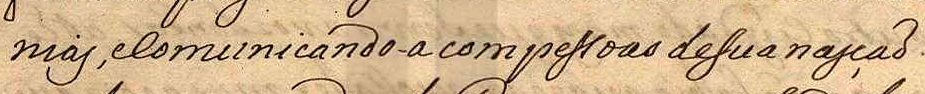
nias, e comunicando-a com pessoas de sua nasçaõ
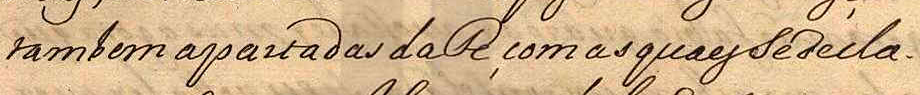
tambem apartadas da Fe, com as quaes se decla
